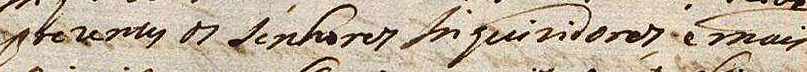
prezentes os senhores Inquizidores, e mais
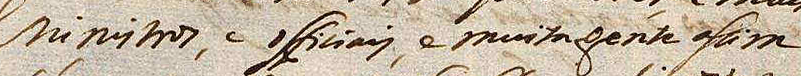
ministros, e officiais, e muita gente assim
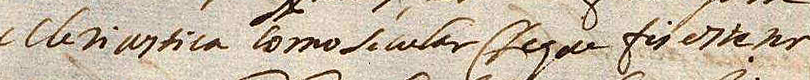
ecleziastica como secular De que fis este ter
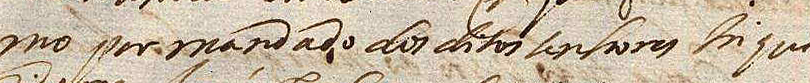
mo por mandado dos ditos senhores Inqui
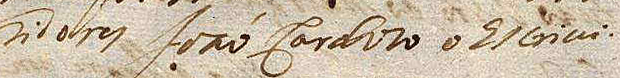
zidores Joaõ Cardozo o Escriui.
